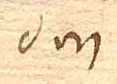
sor̄
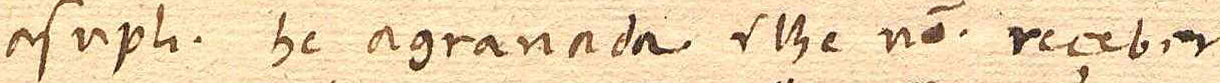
a supli. he agrauada ē lhe nō. reçeber
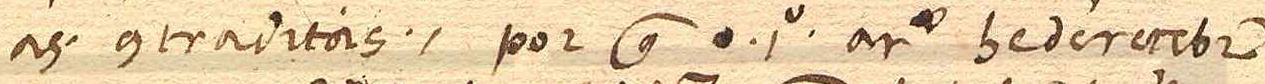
as. ꝯtraditas ./ por q̄ o .1o. aro he de reçebr̄
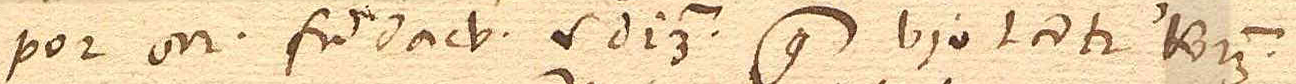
por ser. fūdado. ē diz̄ q̄ vjolāte Roiz̄
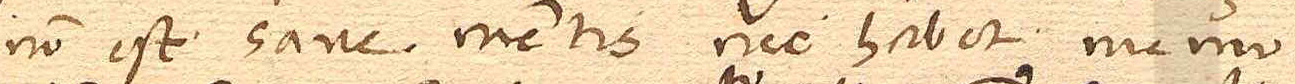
nō est. sane mētis nec habet memo
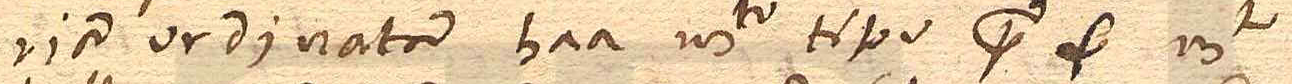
riā ordjnatā haa mto tēpo p̄o ꞩ mto
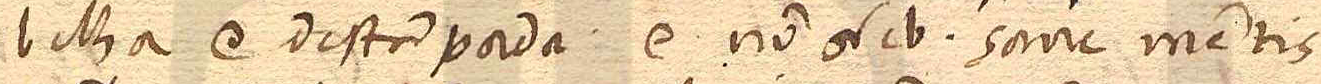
velha e destāpada e nō sēdo. sane mētis
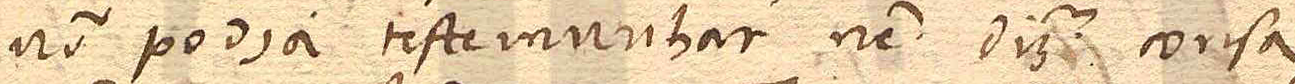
nō podja testemunhar nē. diz̄. cousa
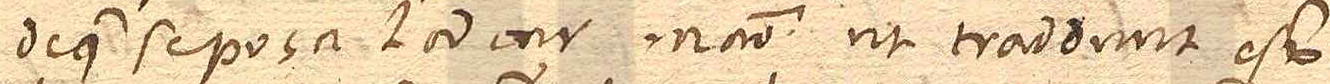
de q̄ se posa lāçar maõ ut traddimt esp̄
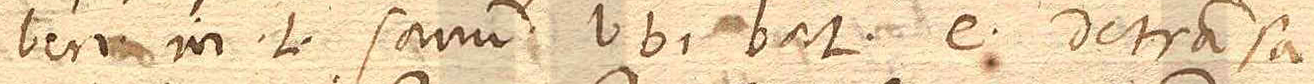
vere in .L. sann̄ vbi bal. e detrāsa
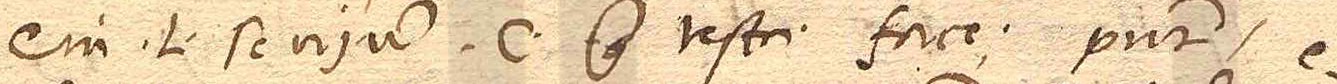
e in .L. se ujū, C. q̄ teste face. put̄ / e
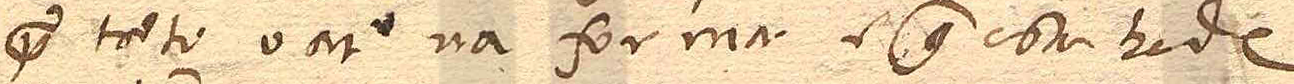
p̄otāto o aro na forma ē q̄ esta he de
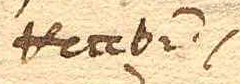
Reçebr̄. /
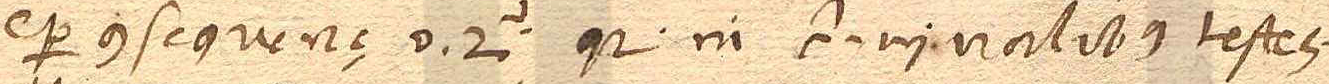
e ꝑ ꝯsequenç o .2o. ꝯr in cimjnalibꝯ testes.
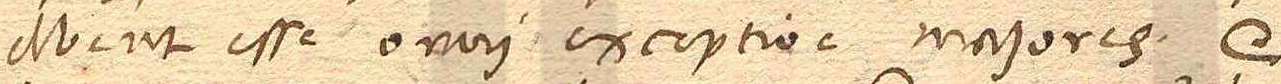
debent esse onorj exceptioe majores. e
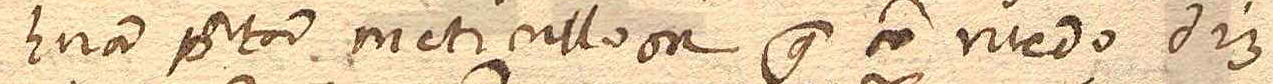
huā pa tā meticullosa q̄ c̄o medo diz.
